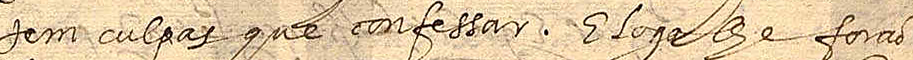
tem culpas que confessar. E logo lhe foraõ
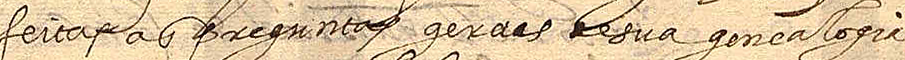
feitas as preguntas geraes de sua genealogia
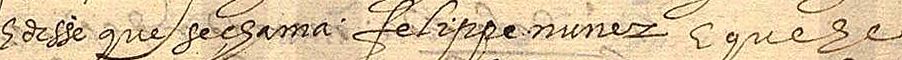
E disse que se çhama felippe nunez E que he
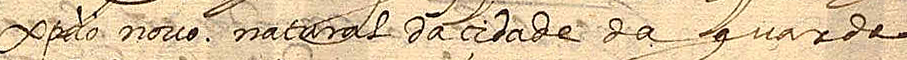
xpão nouo. natural da çidade da guarda
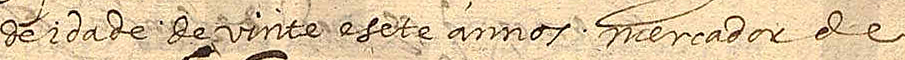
de idade de vinte e sete annos. mercador de
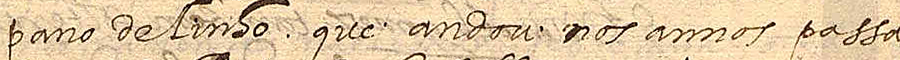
pano de linho. que andou nos annos passa
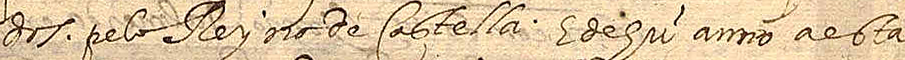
dos. pelo Reyno de Castella. E de hū anno a esta
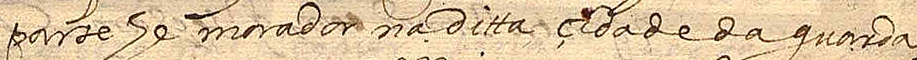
parte he morador na ditta çidade da guarda
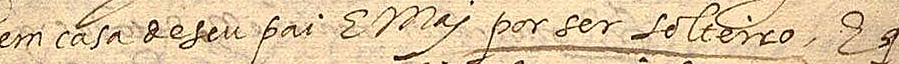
em casa de seu pai E Maj por ser solteiro E q̄
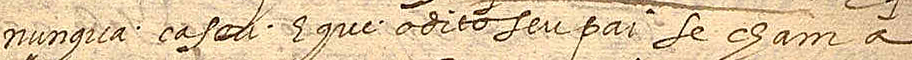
nunqua casou E que o dito seu pai se chama
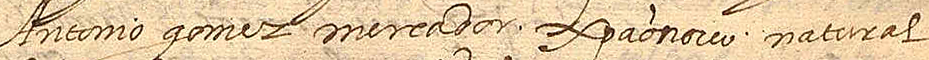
Antonio gomez mercador, Xpaõ nouo. natural
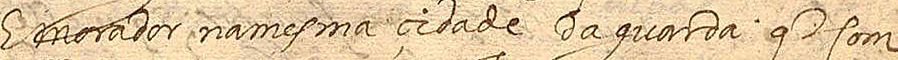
E morador na mesma çidade da guarda q̄ Com
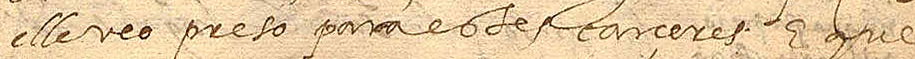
elle veo preso para estes carçeres. E que
